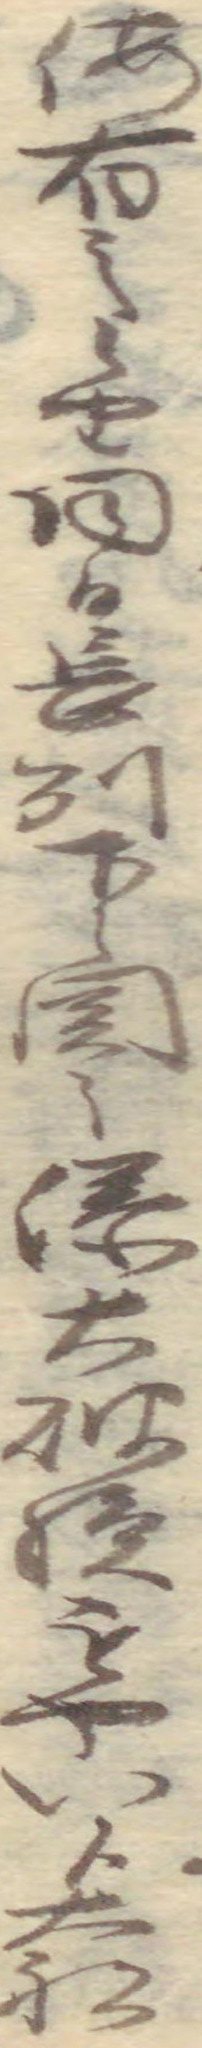海有之候由同日長州下之関之湊大破損もやい候大船
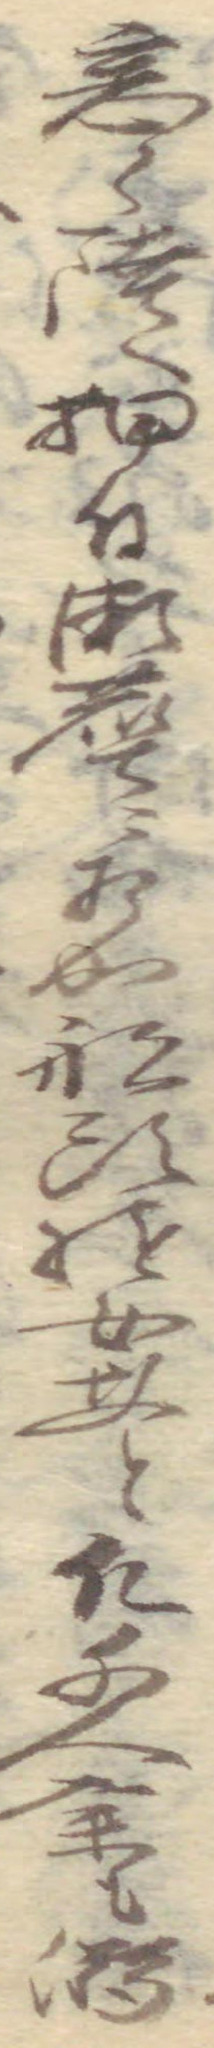悉く陸へ押付微塵ニ相成船頭遊女なと凡千人余も溺
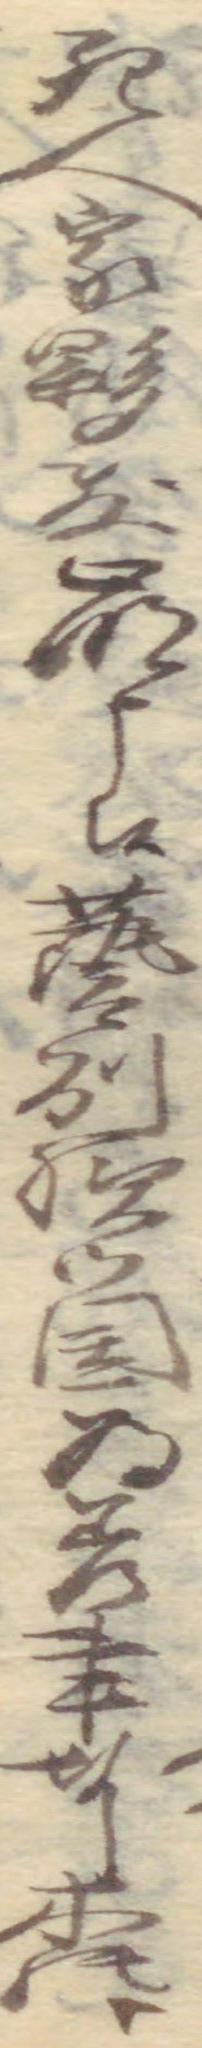死人家夥敷崩申候芸州様御国為差事なし木の
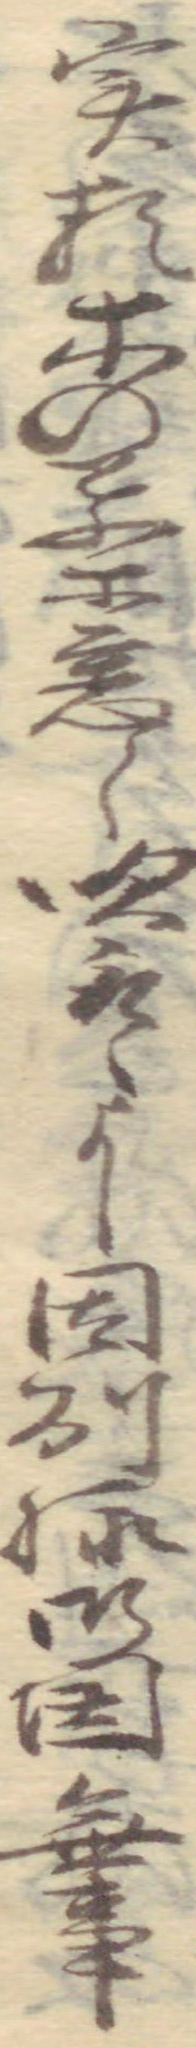実類木の葉等悉く吹取候よし因州様御国無事
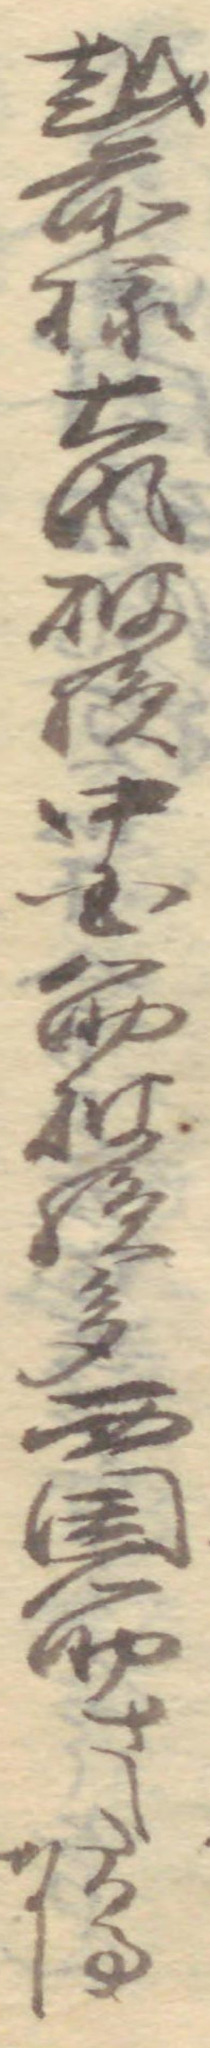越前様大風破損中国筋破損多西国筋さしたる事なし
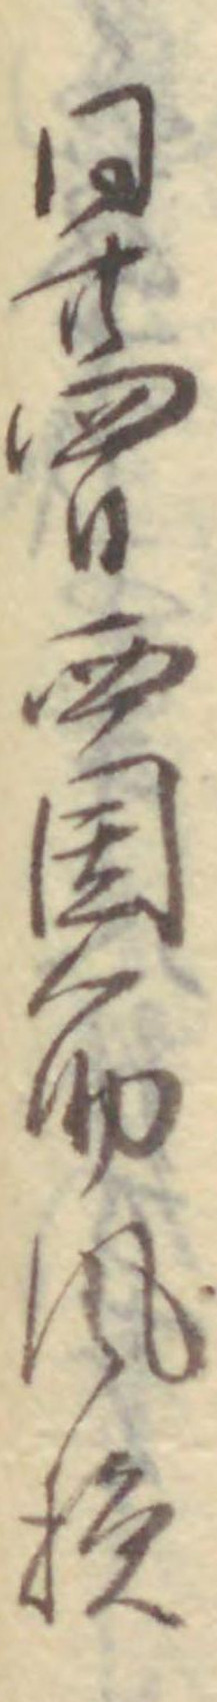同廿四日西国筋風損
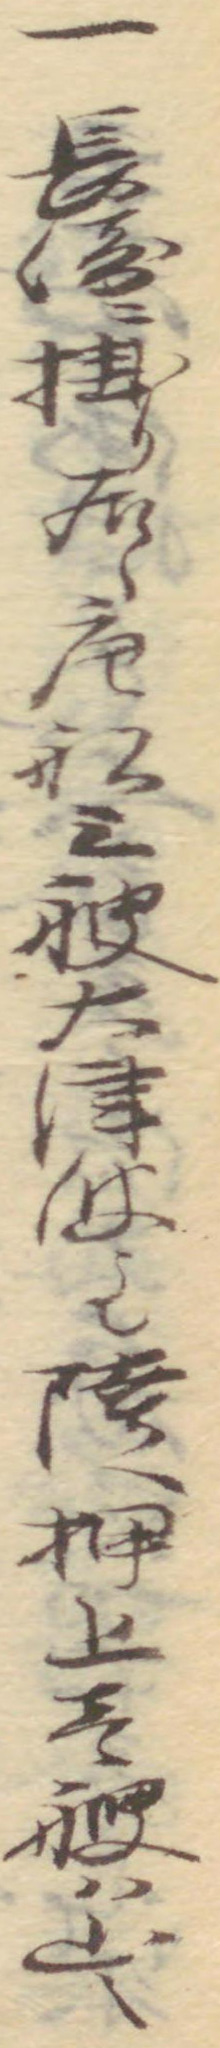一長崎ニ掛り居候唐船三艘大津波ニて陸へ押上壱艘ハ山之
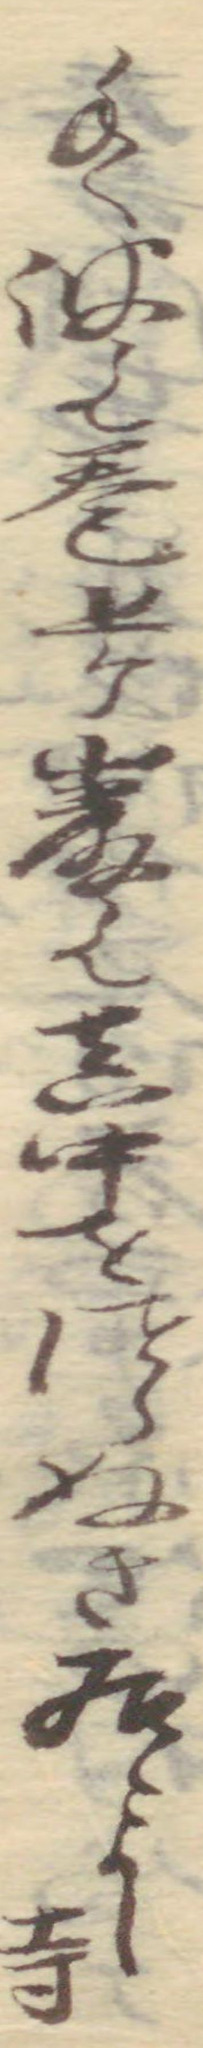手へ波ニて巻上ケ巌ニて真中をつらぬき居候よし寺
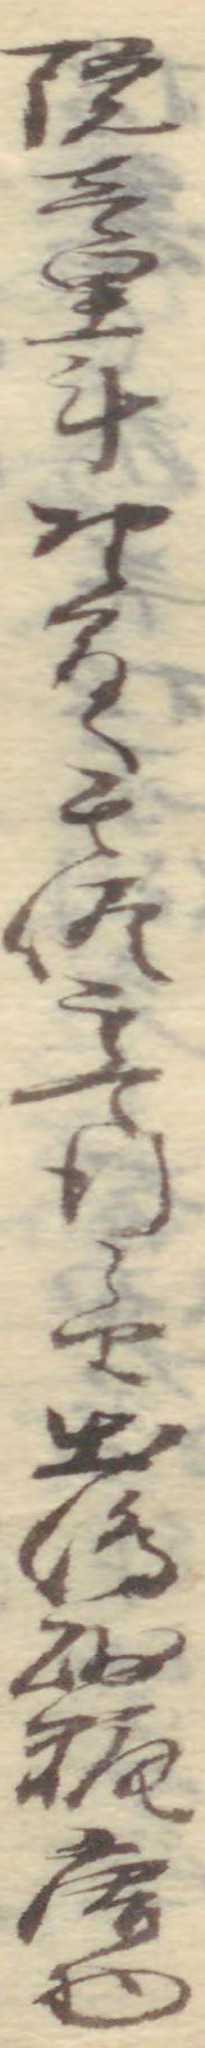院一里斗野間へ其儘もて行候由出嶋砂糖唐物
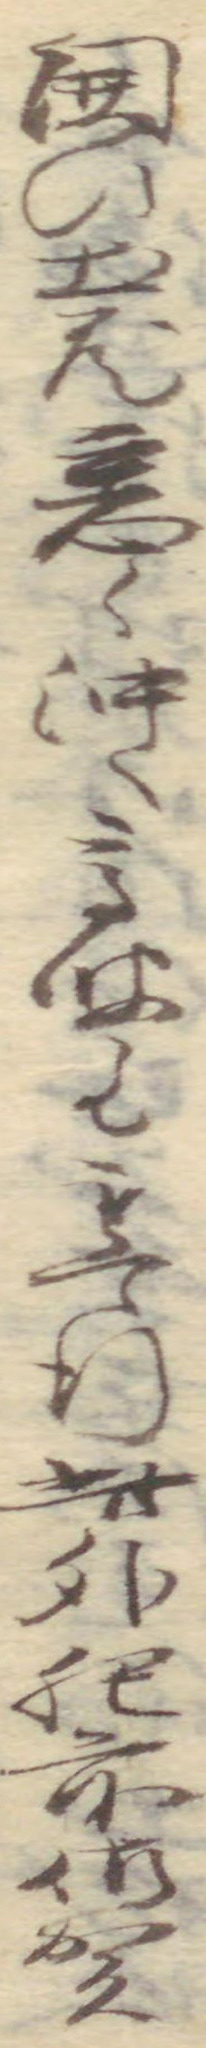囲ひ土蔵悉く沖へ高波ニてもて行此外肥前佐賀
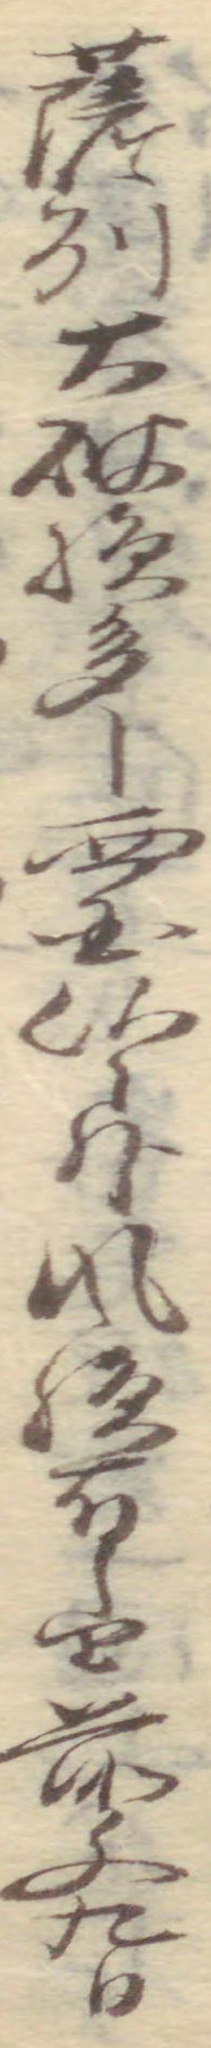薩州大破損多し西国以之外風損有之由前文九日
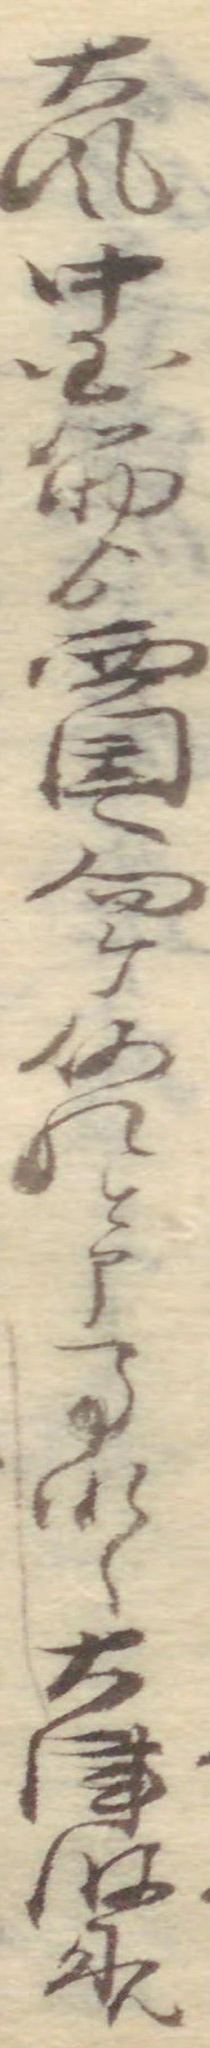大風中国筋ゟ西国へ向ケ何れと申事なく大津波来る
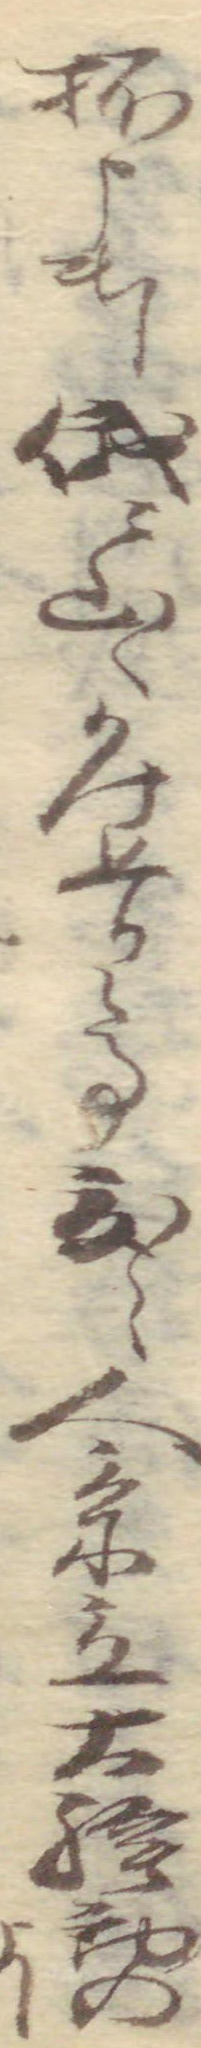抔申出候俄ニ山へかけ上り候事度々人気立大騒動のよし
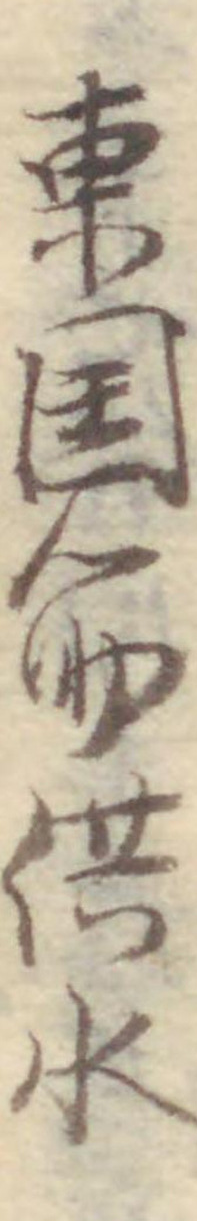東国筋洪水
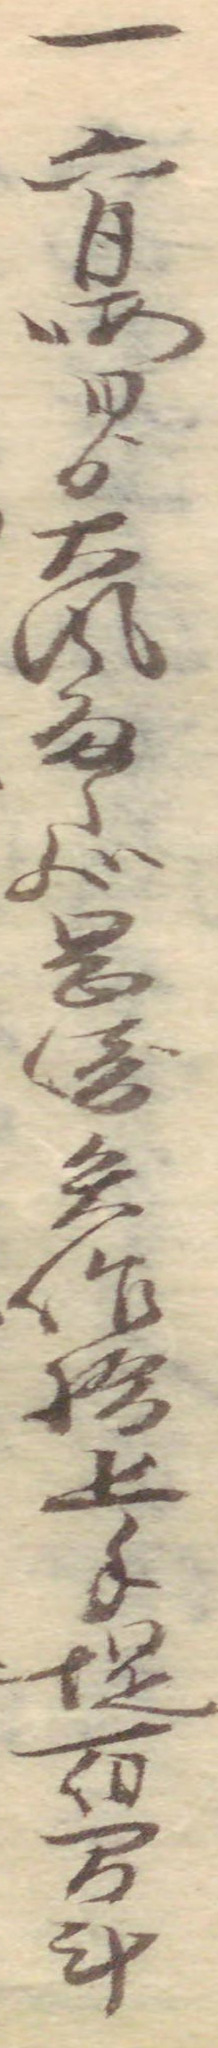一六月晦日ゟ大風雨候処岡崎矢作橋上手堤百間斗
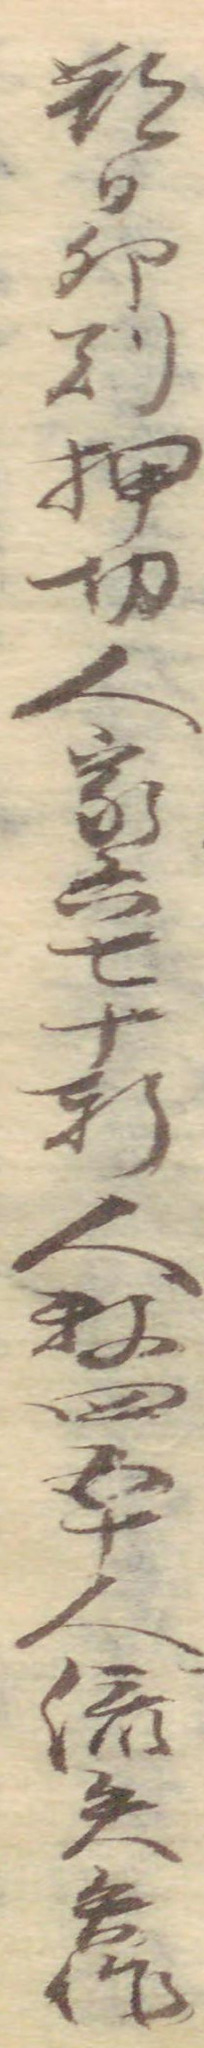朔日卯刻押切人家六七十軒人数四五十人流失矢作
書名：鶯宿雑記. 巻199-200
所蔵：国立国会図書館 National Diet Library, JAPAN
